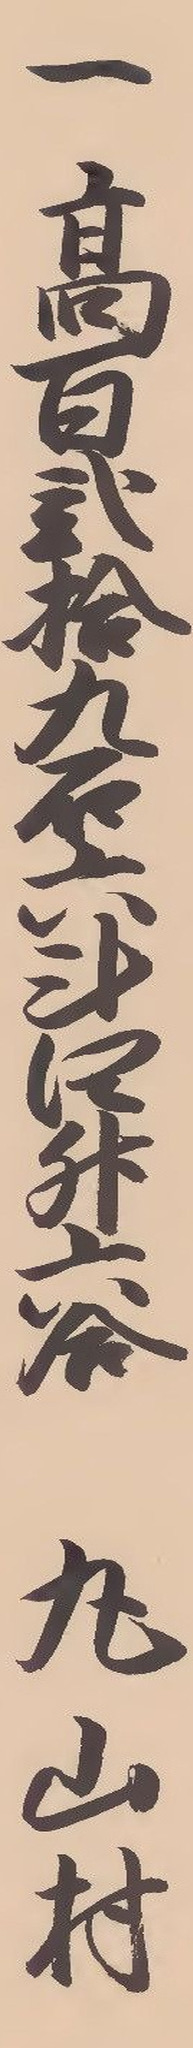一高百弐拾九石六斗四升六合丸山村
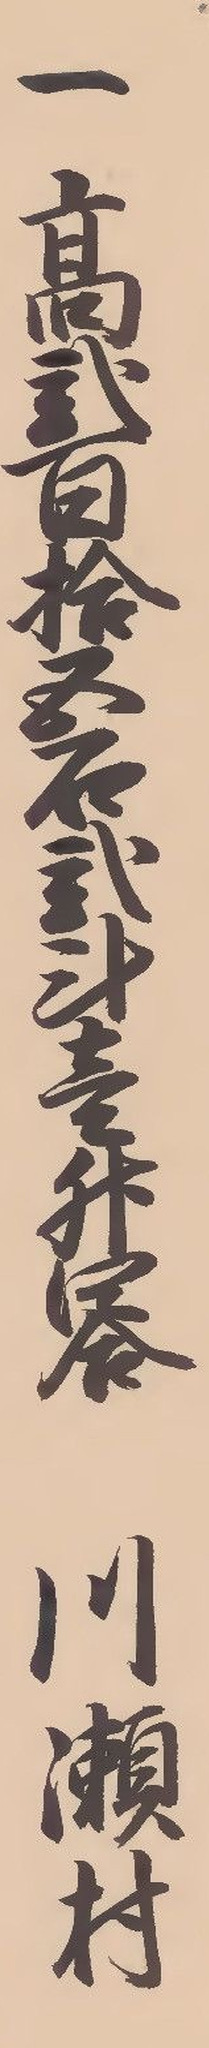一高弐百拾五石弐斗壱升四合川瀬村
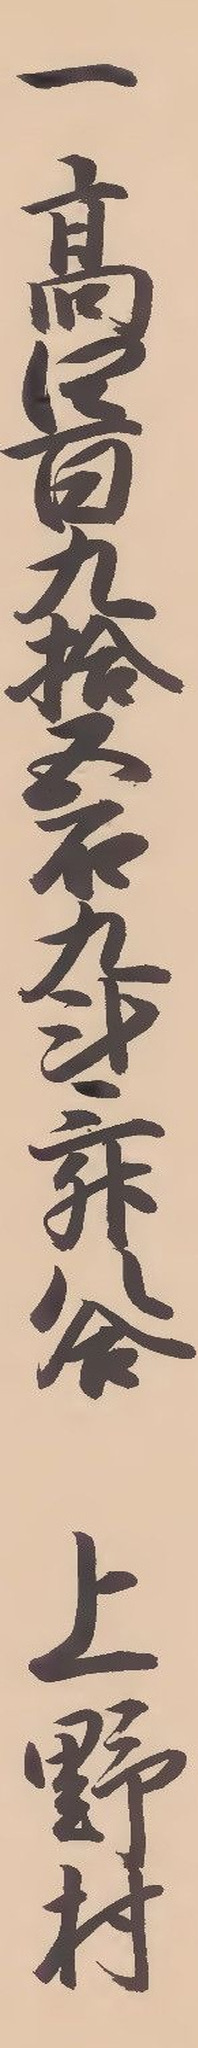一高四百九拾五石九斗三升八合上野村
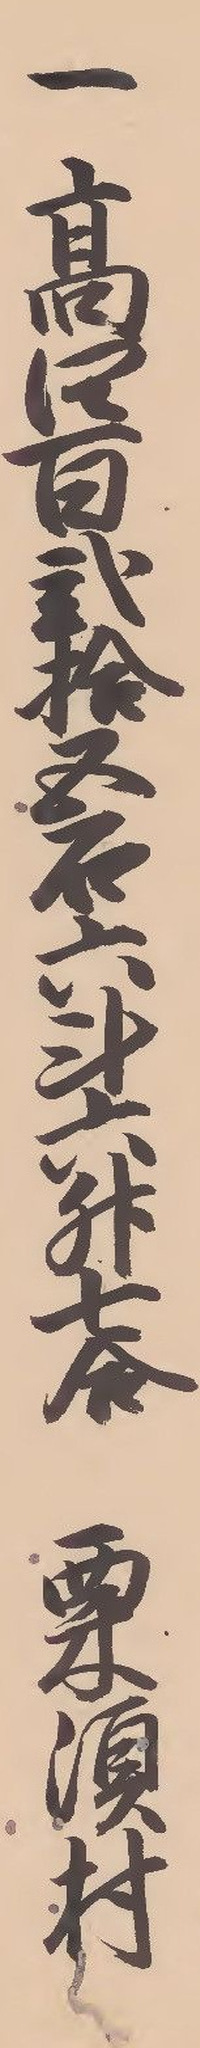一高四百弐拾五石六斗六升七合栗須村

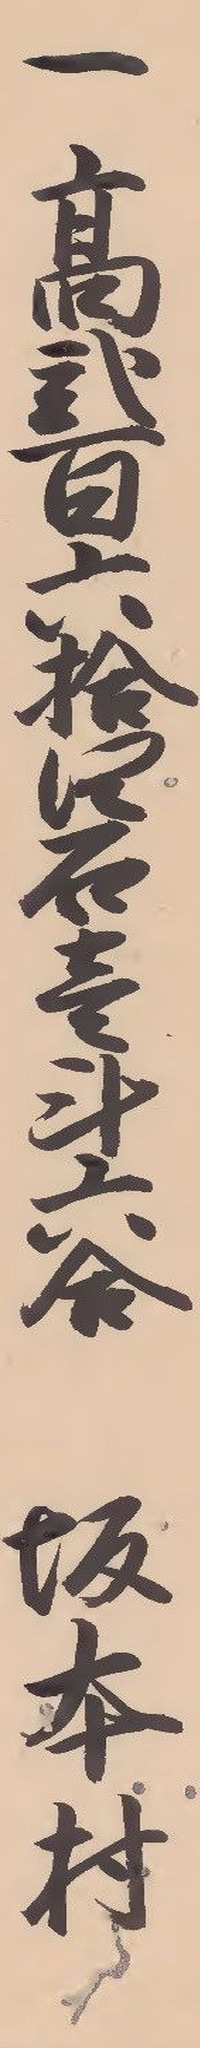一高弐百六拾四石壱斗六合坂本村
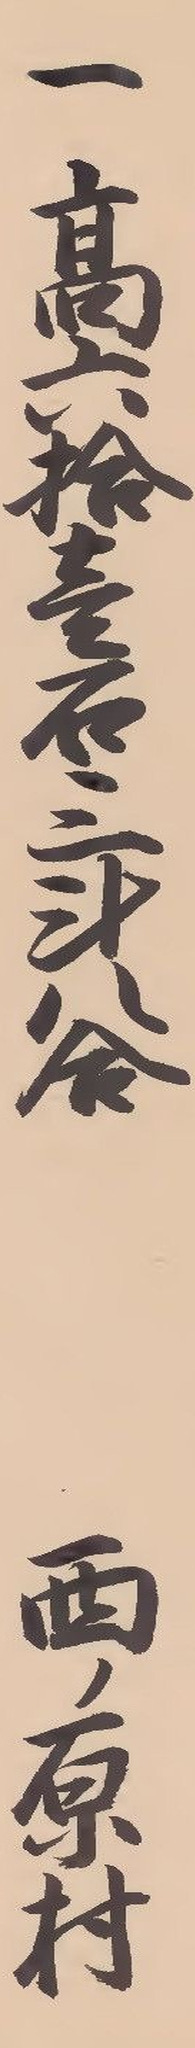一高六拾壱石三斗八合西ノ原村
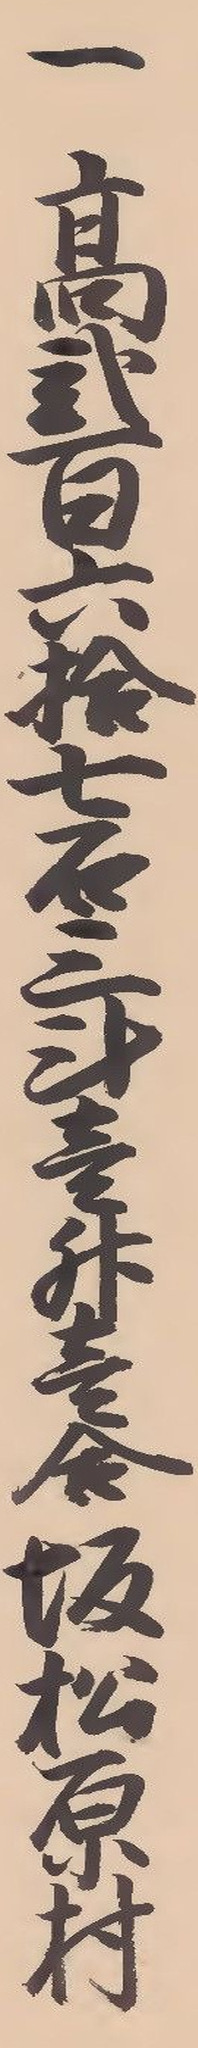一高弐百六拾七石三斗壱升壱合坂松原村
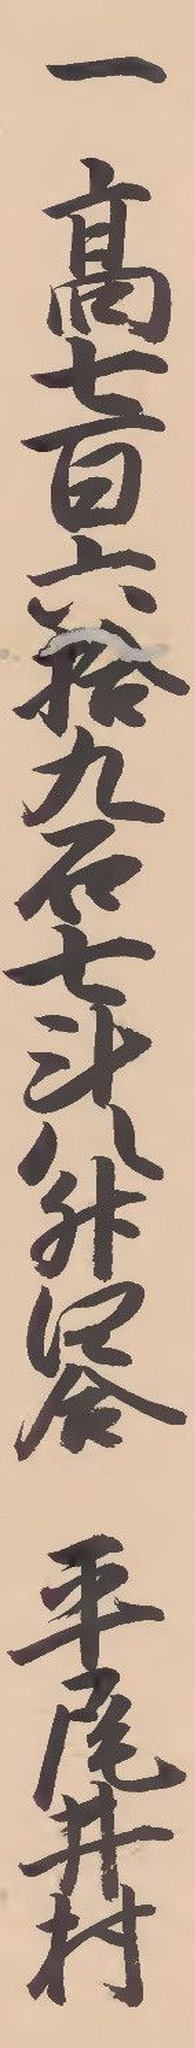一高七百六拾九石七斗八升四合平尾井村
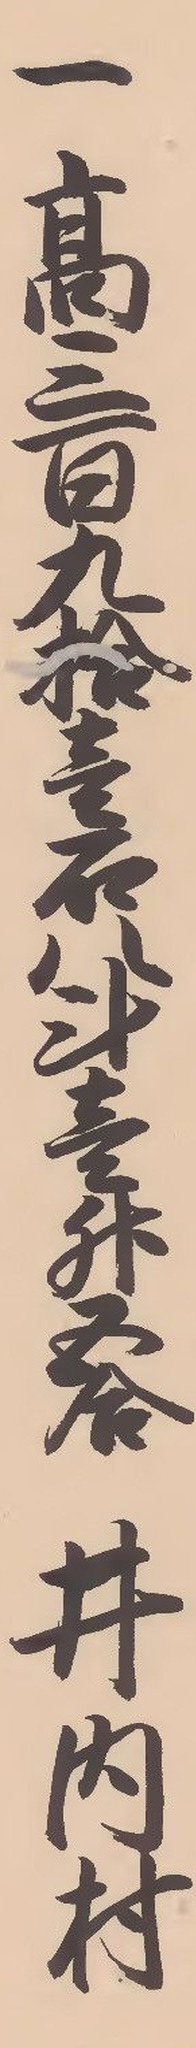一高三百九拾壱石八斗壱升五合井内村
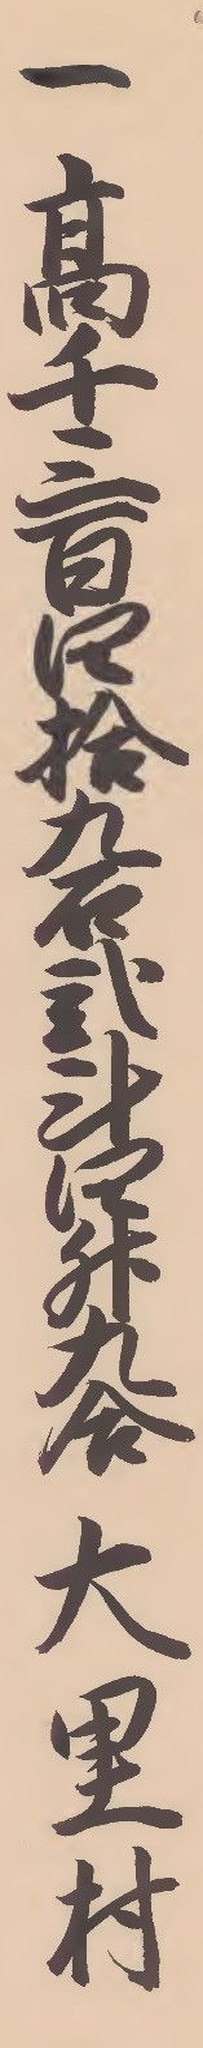一高千三百四拾九石弐斗四升九合大里村
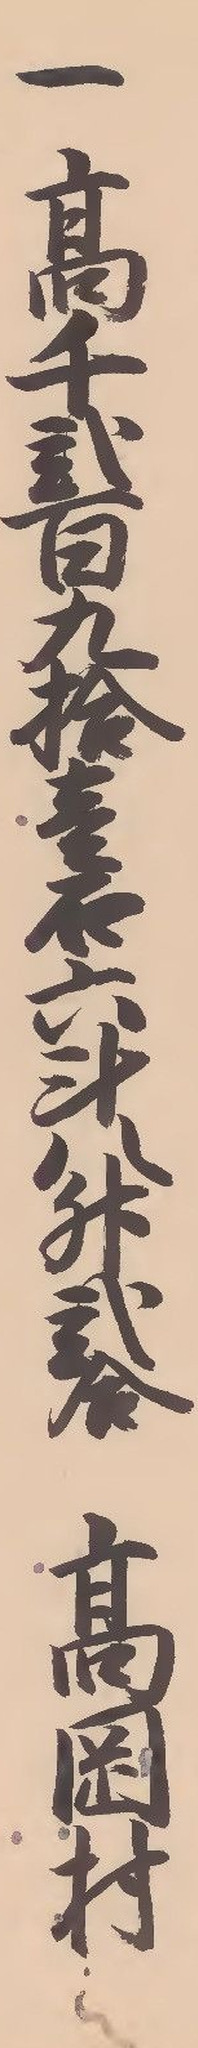一高千弐百九拾壱石六斗八升弐合高岡村

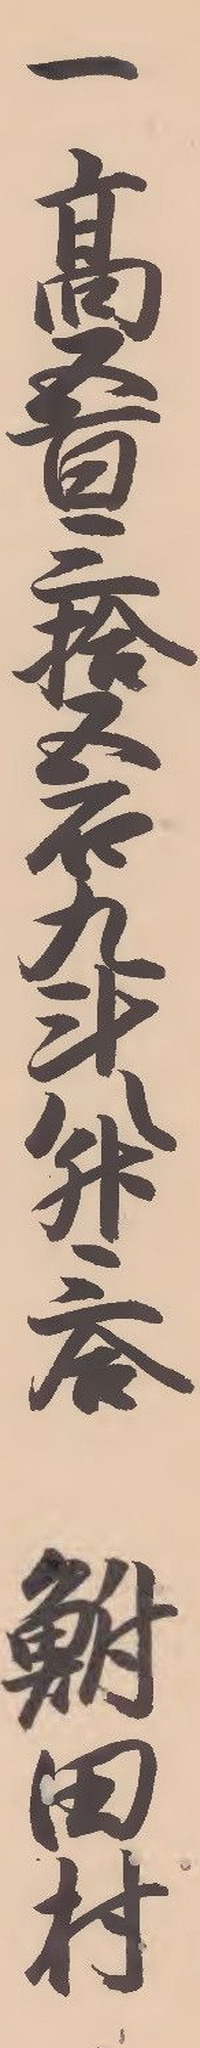一高五百三拾五石九斗八升三合鮒田村
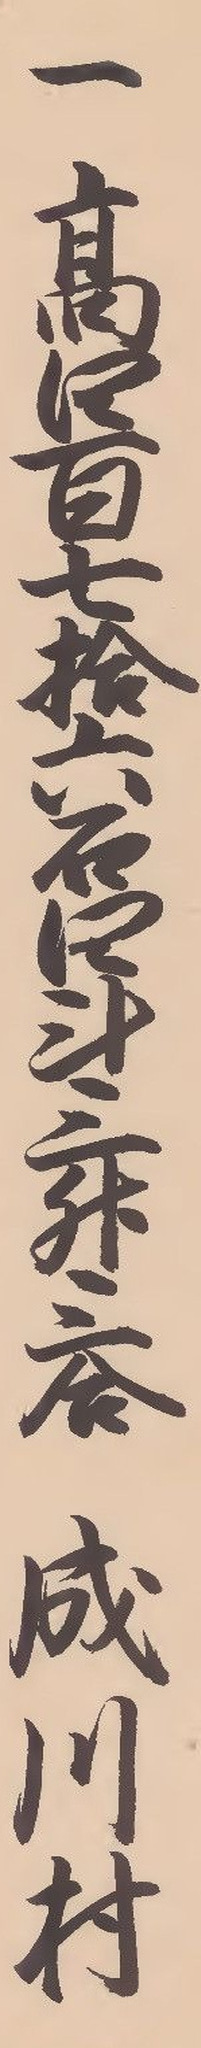一高四百七拾六石四斗三升三合成川村
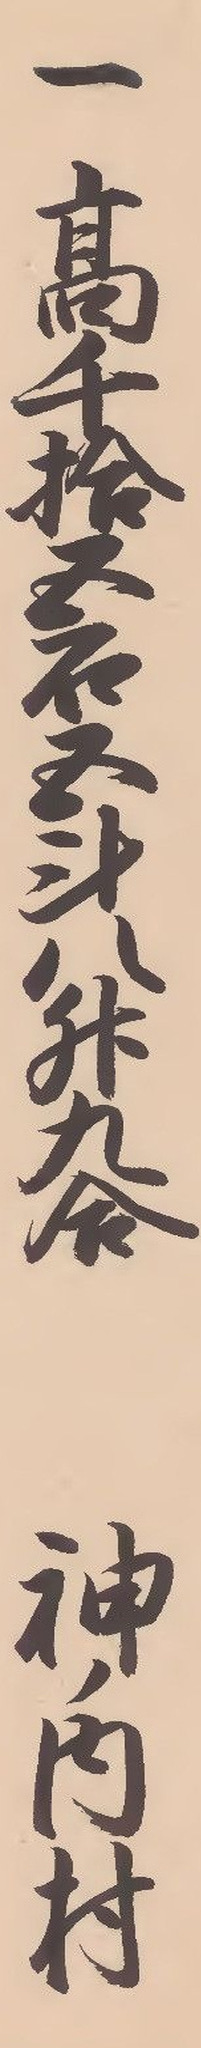一高千拾五石五斗八升九合神ノ内村
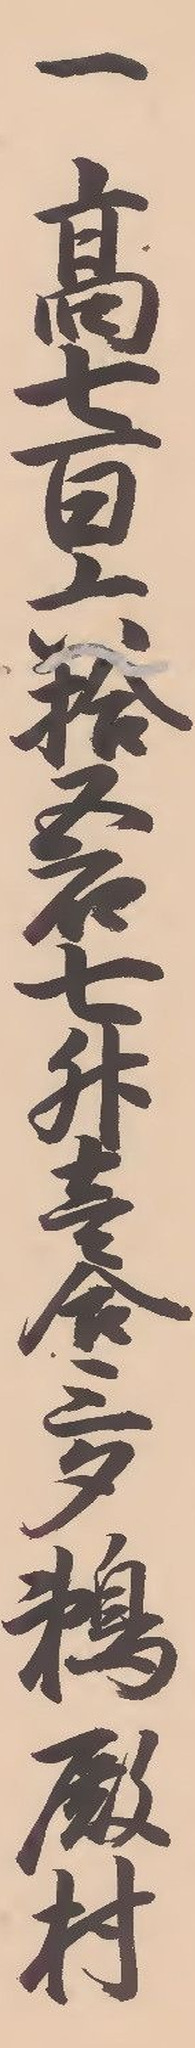一高七百六拾五石七升壱合三勺鵜殿村
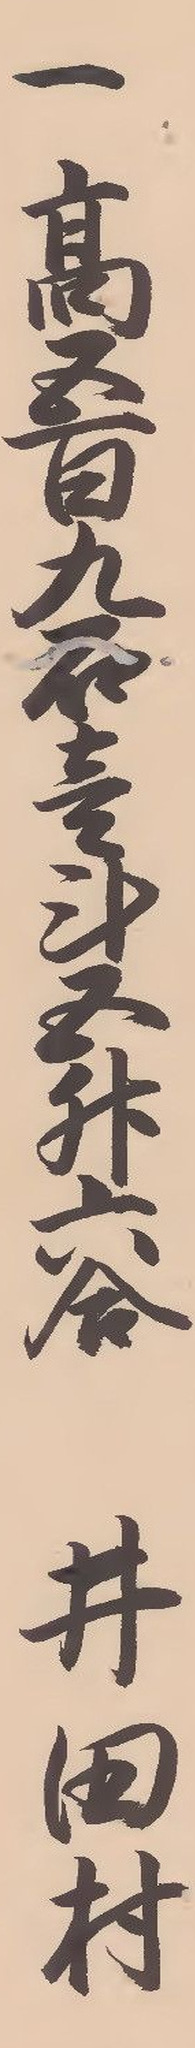一高五百九石壱斗五升六合井田村
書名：紀伊国郷帳
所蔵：国立公文書館 National Archives of Japan
